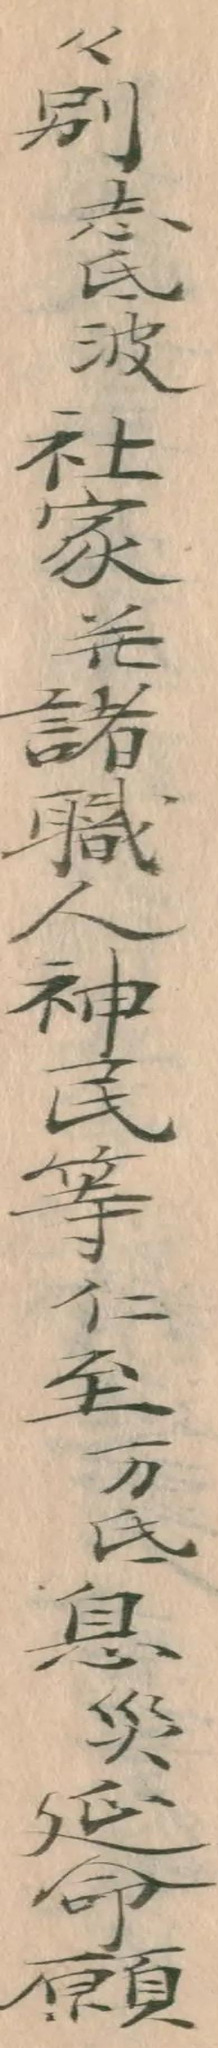々別志氐波社家并諸職人神民等仁至万氐息災延命願
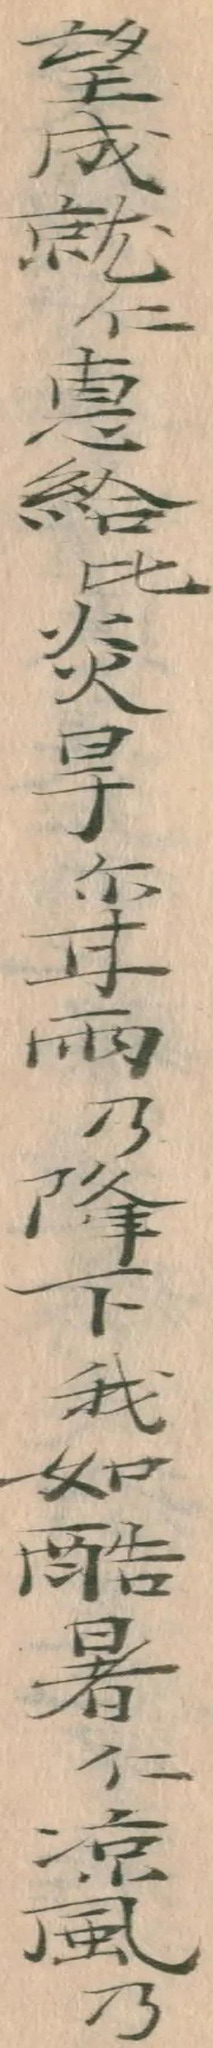望成就仁恵給比炎旱尓甘雨乃降下我始酷暑仁涼風乃
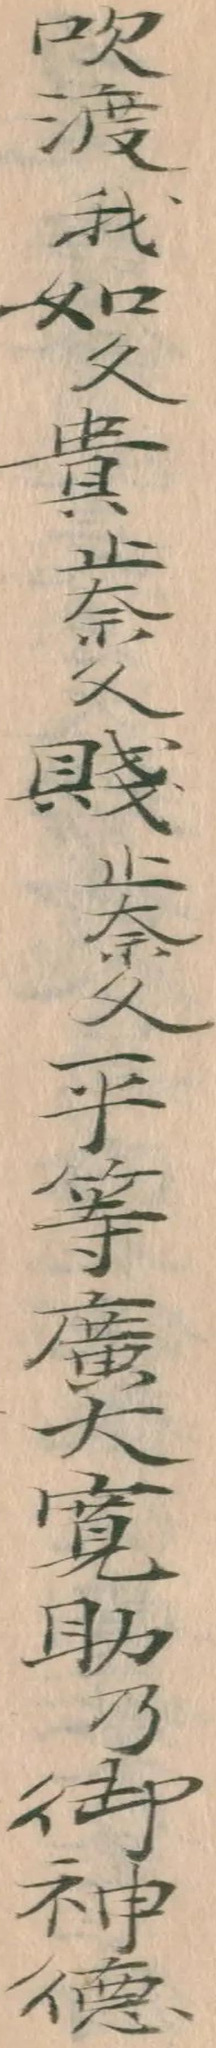吹渡我如久貴止奈父久賎止奈久平等廣大寛助乃御神徳
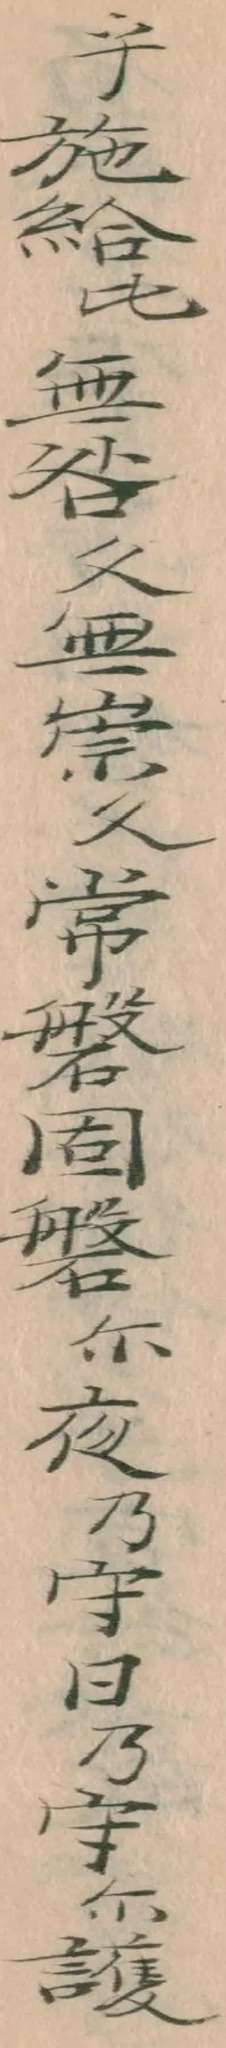于施給比無咎久無崇久常磐固磐尓夜乃守日乃守尓護
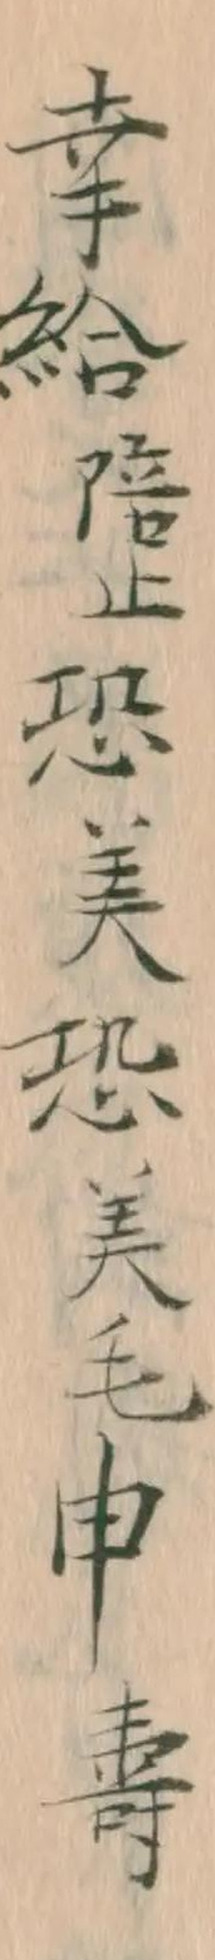幸給陪止恐美恐美毛申壽
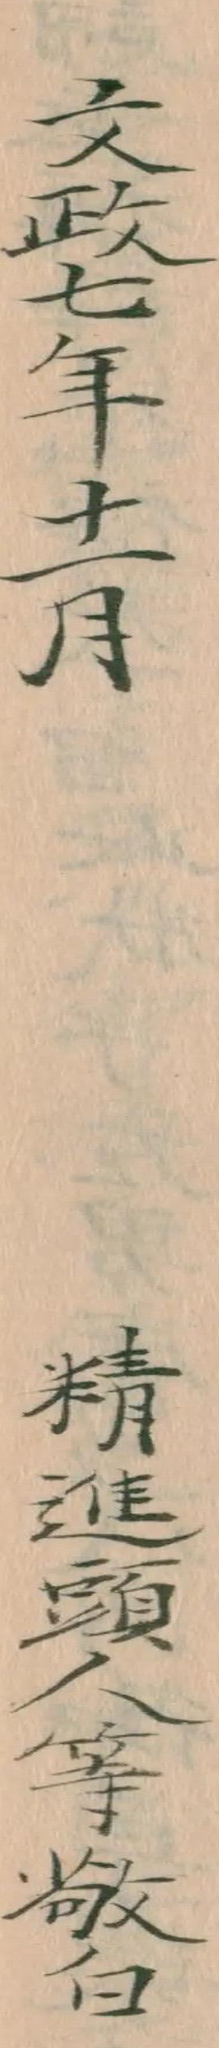文政七年十一月精進頭人等敬白
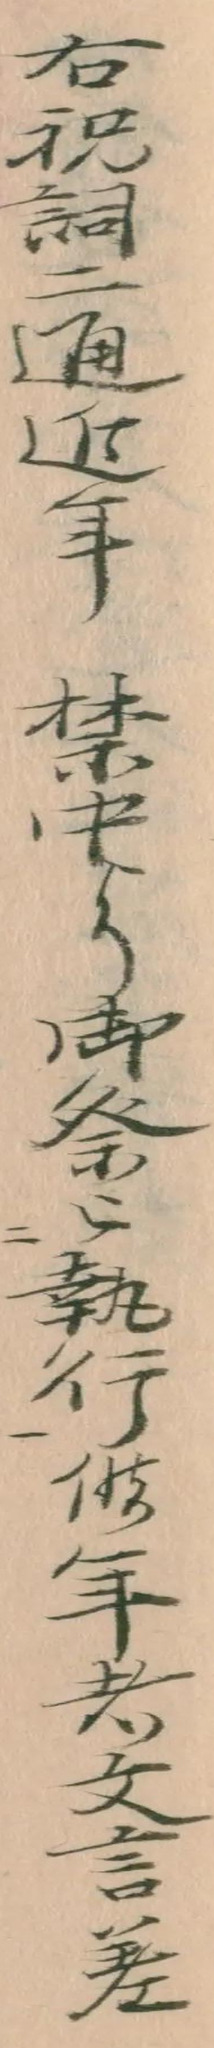右祝詞二通近年禁中より御祭被執行年者文言差
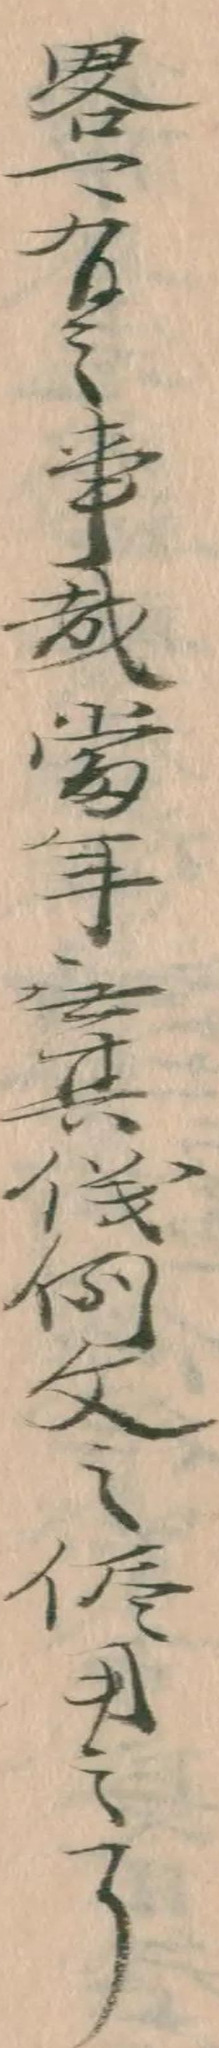畧可有之事哉當年無其儀例文之侭用之了
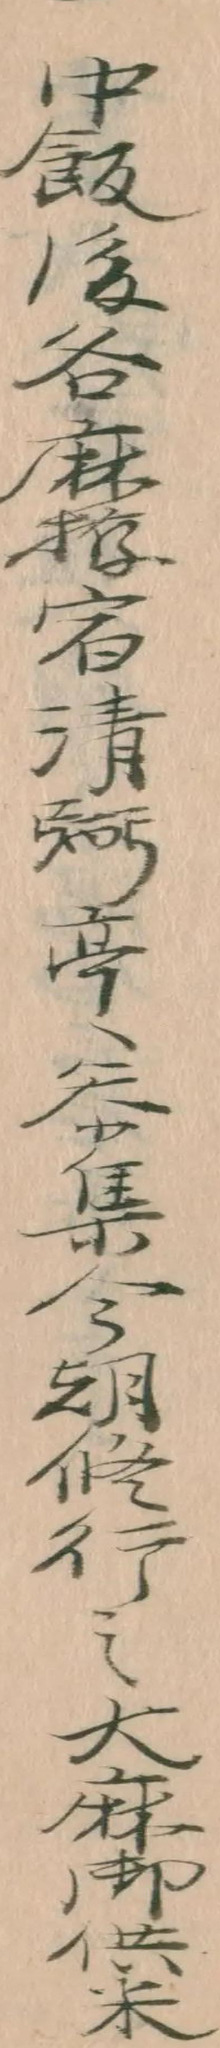一中飯後各麻拵宿清弼亭へ参集今朝修行之大麻御供米
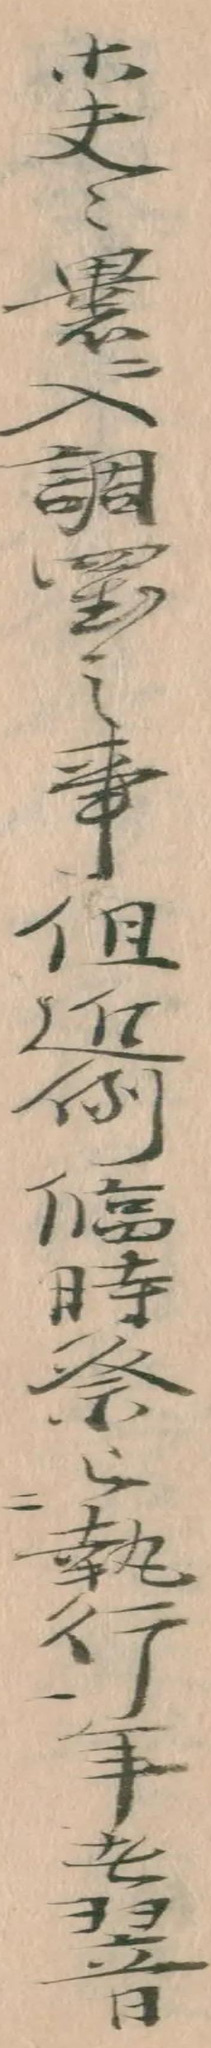等夫々褁ニ入調置之事但近例臨時祭被執行年は翌日
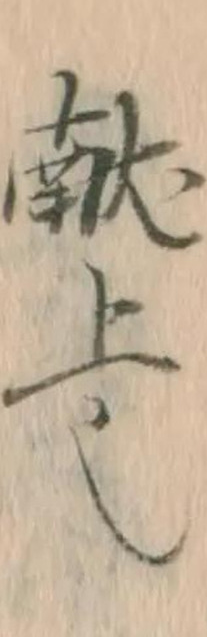献上也
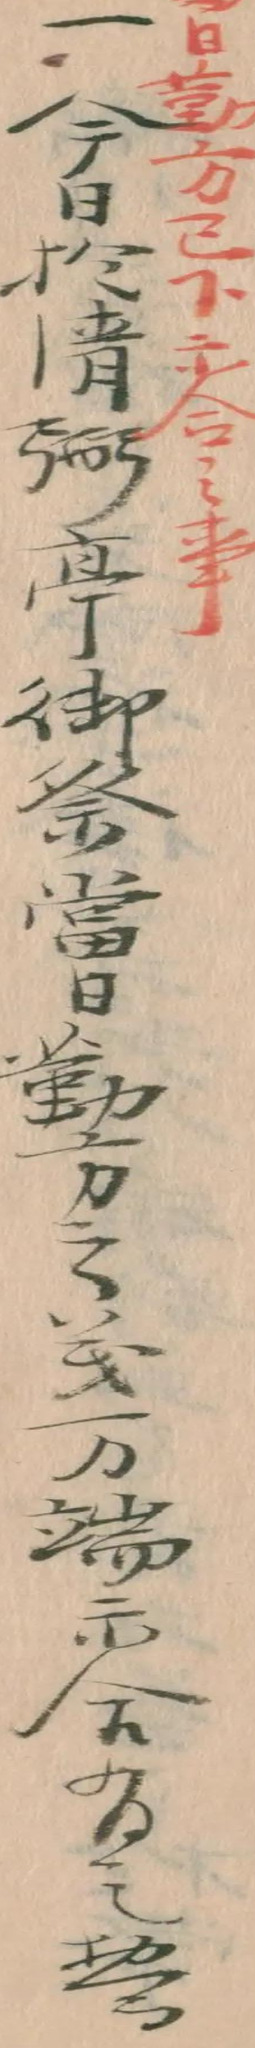一今日於清弼亭御祭當日勤方之義万端示合有之惣而
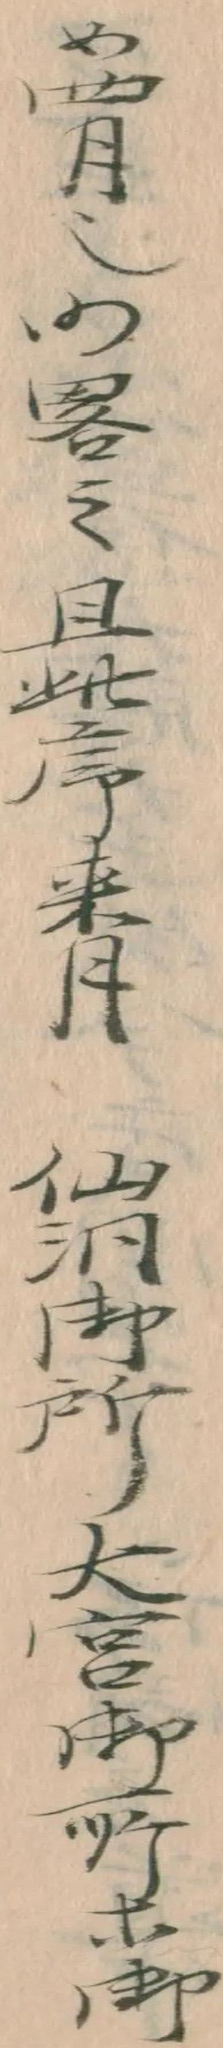如四月也仍畧之且此序来月仙洞御所大宮御所等御
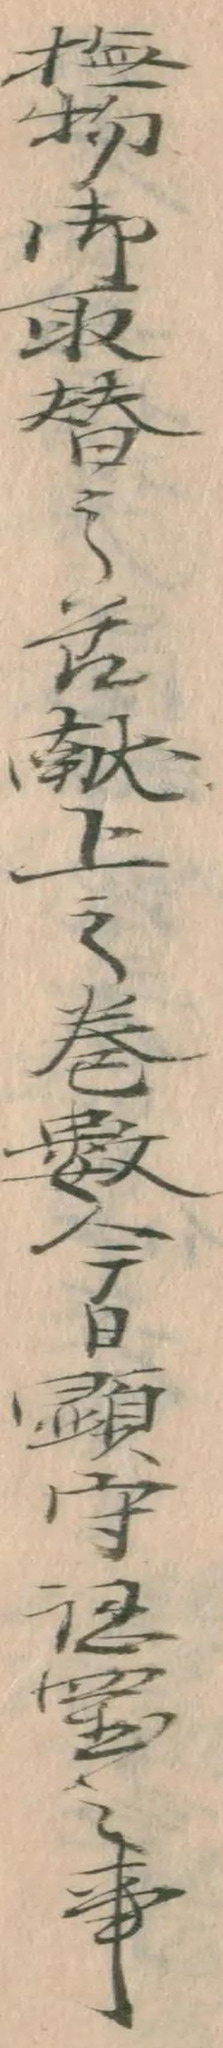撫物御取替之節献上之巻数今日顕守認置之事
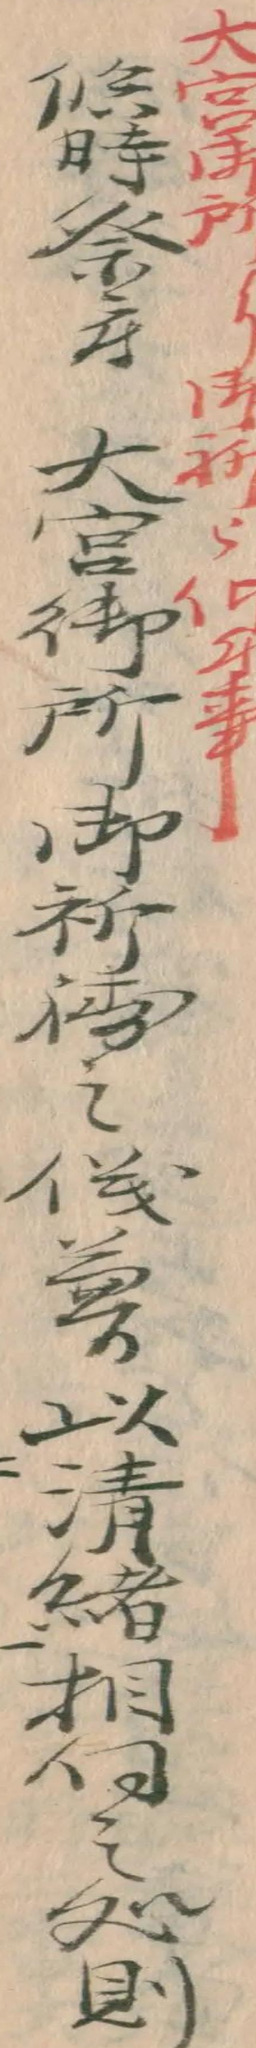一臨時祭ニ付大宮御所御祈祷之儀兼日以清緒相伺之処則
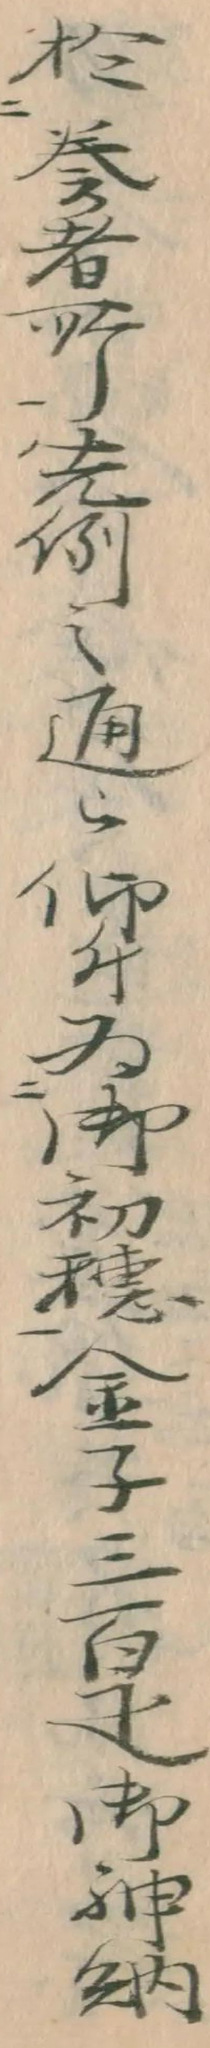於奏者所先例之通被仰付為御初穂金子三百疋御神納
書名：賀茂社記録. 第74冊
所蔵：国立国会図書館 National Diet Library, JAPAN
